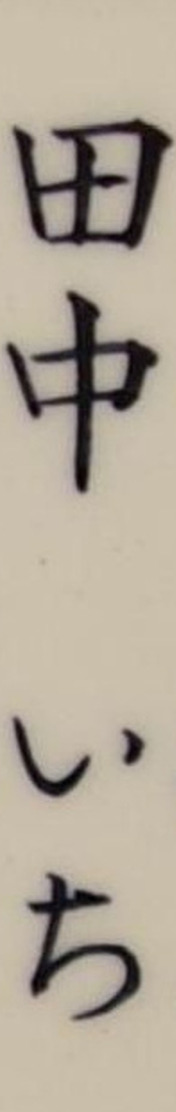田中いち
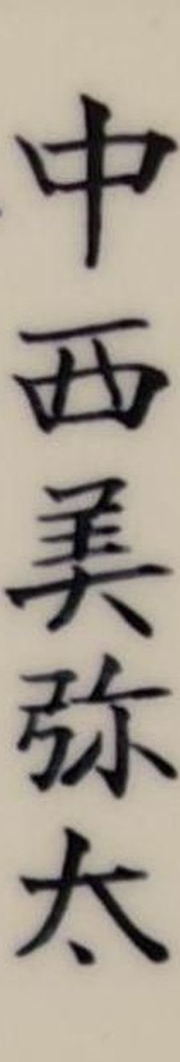中西美弥太
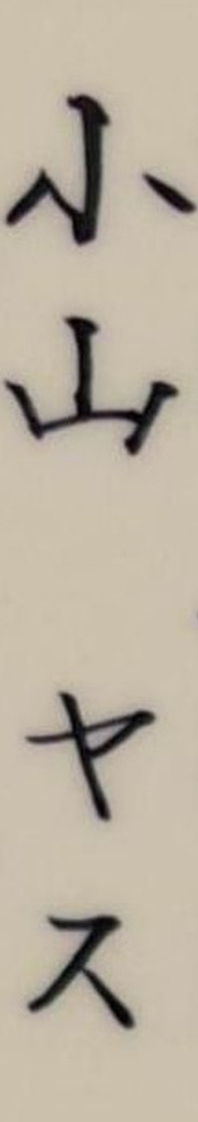小山ヤス
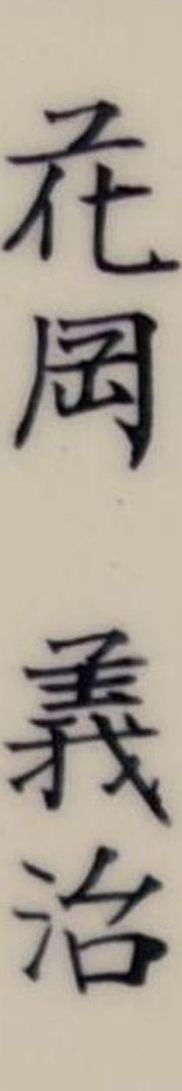花岡義治
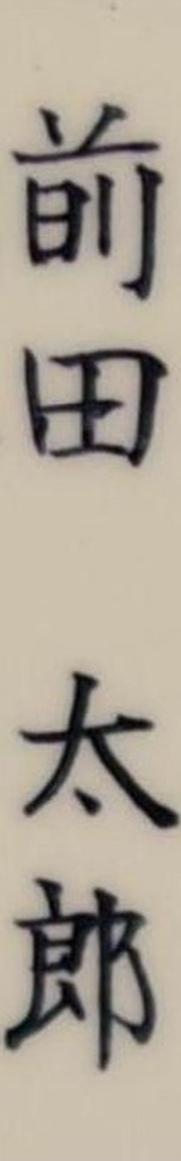前田太郎
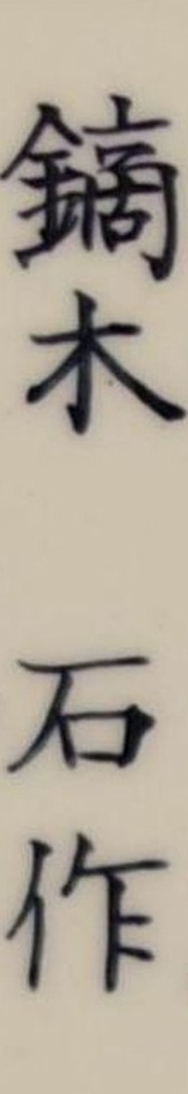鏑木石作
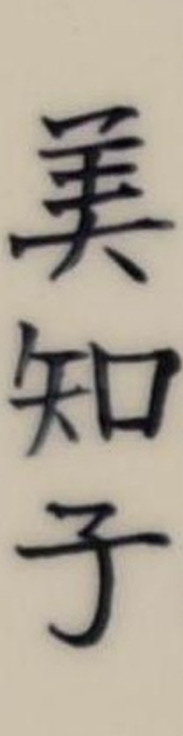美知子
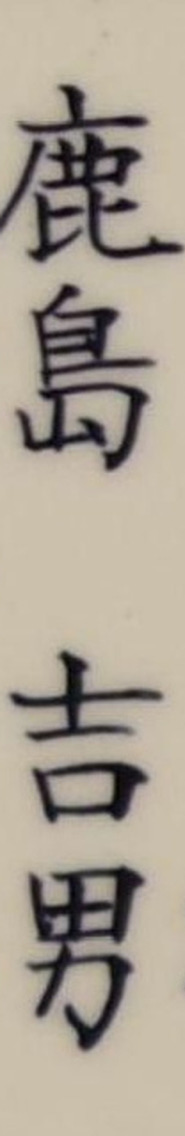鹿島吉男
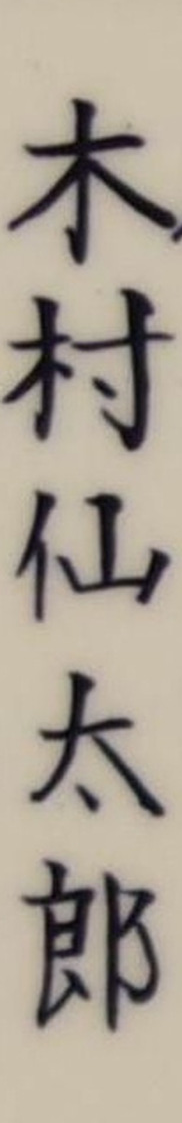木村仙太郎
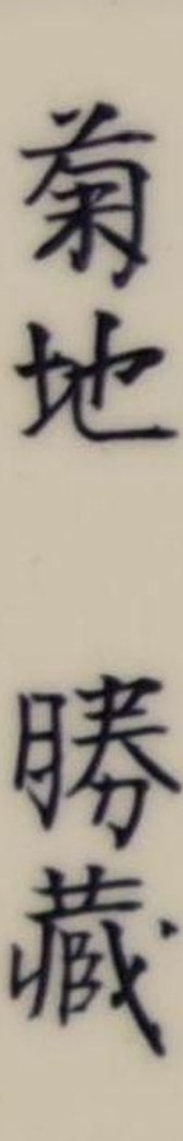菊地勝蔵
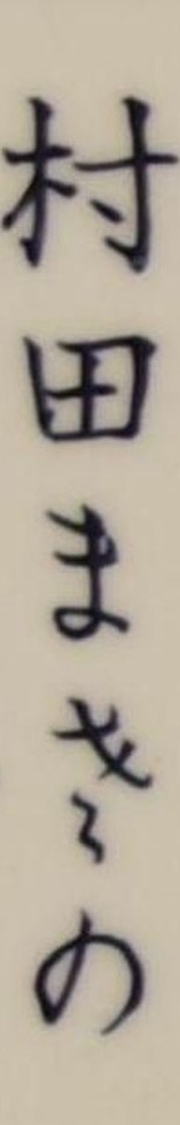村田まさの
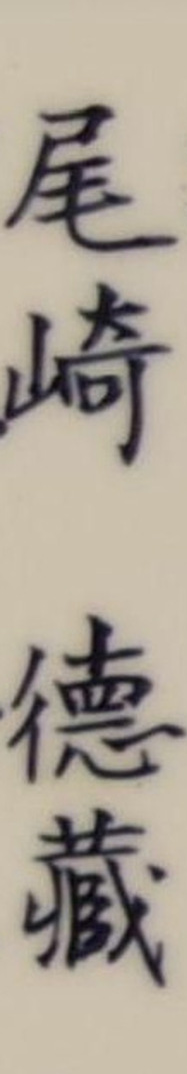尾崎徳蔵
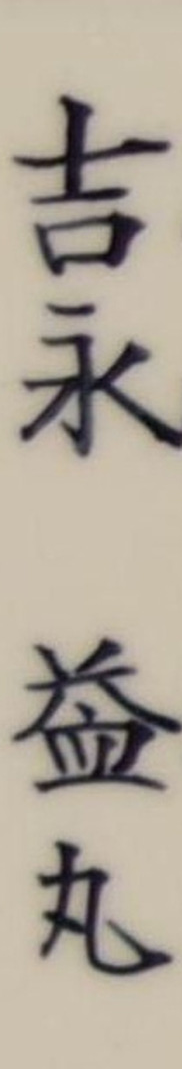吉永益丸
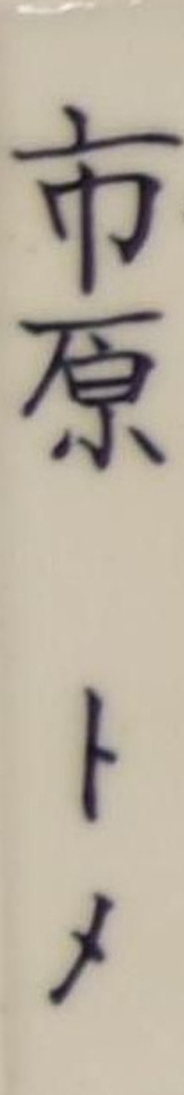市原トメ

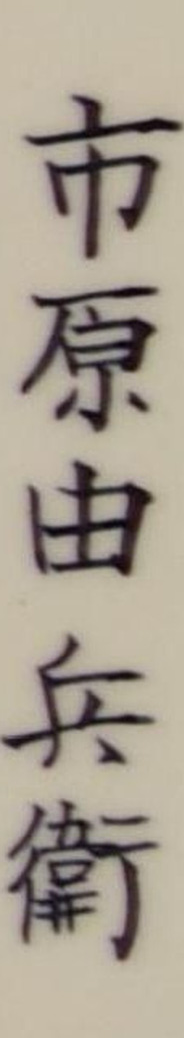市原由兵衛
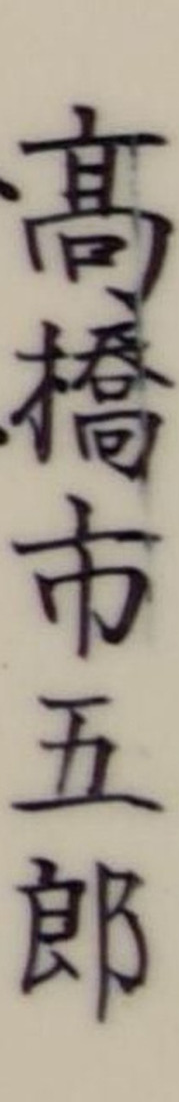高橋市五郎
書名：M~S
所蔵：高野山金剛峯寺
